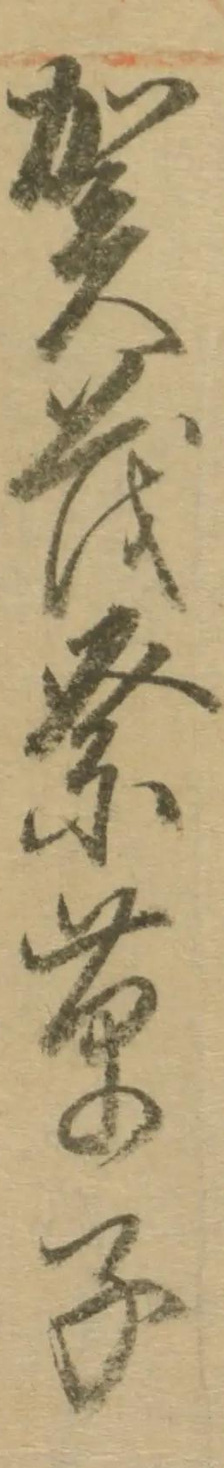賀茂祭草子

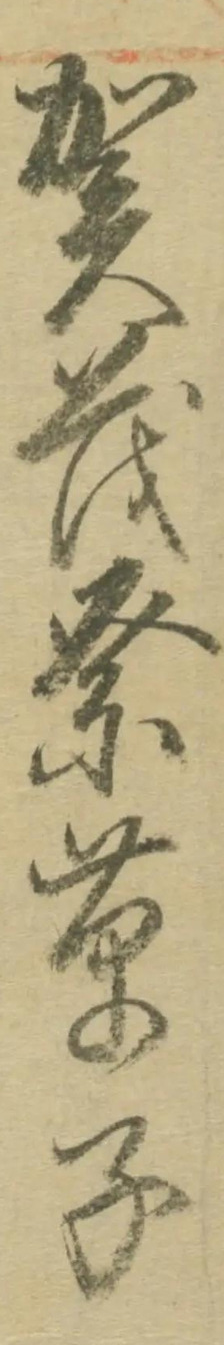賀茂祭草子
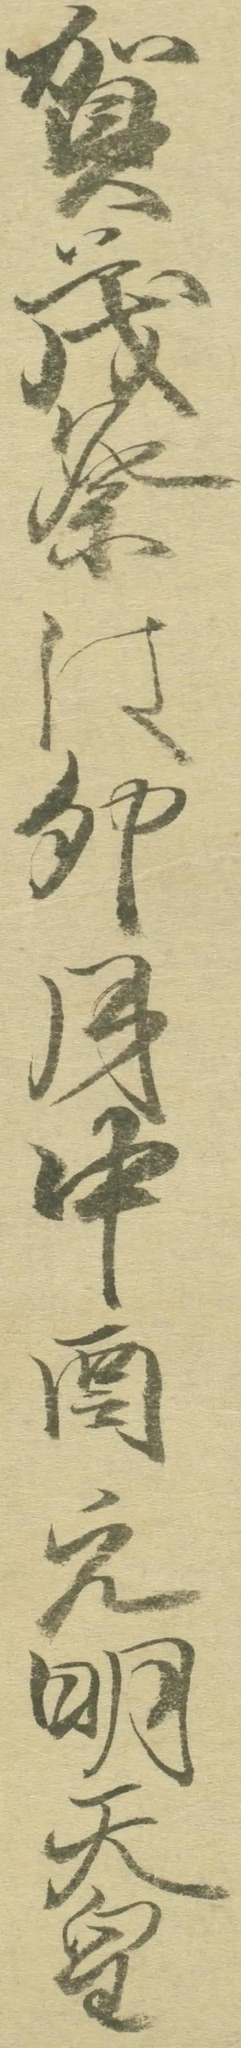賀茂祭は卯月中酉元明天皇
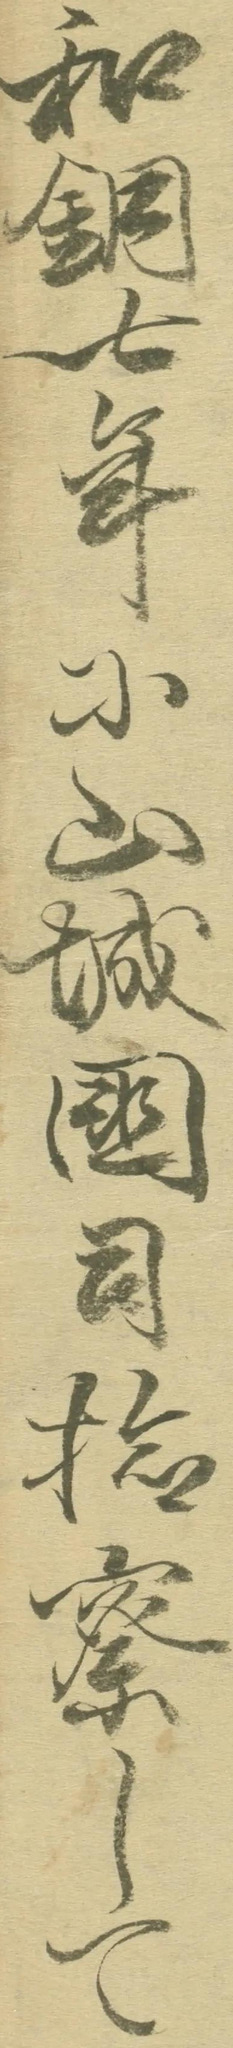和銅七年に山城国司撿察して
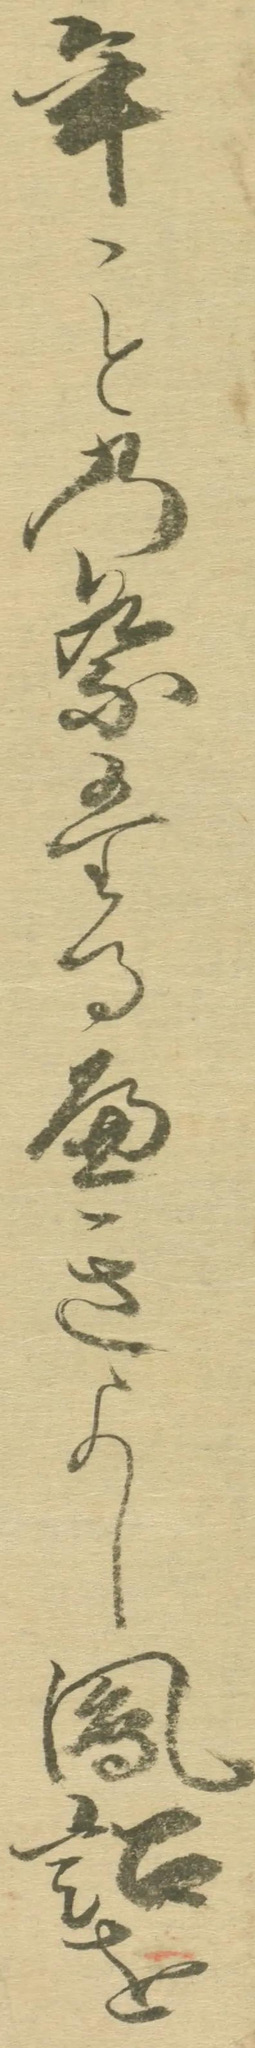年ことの祭たるへきよし鳳詔を
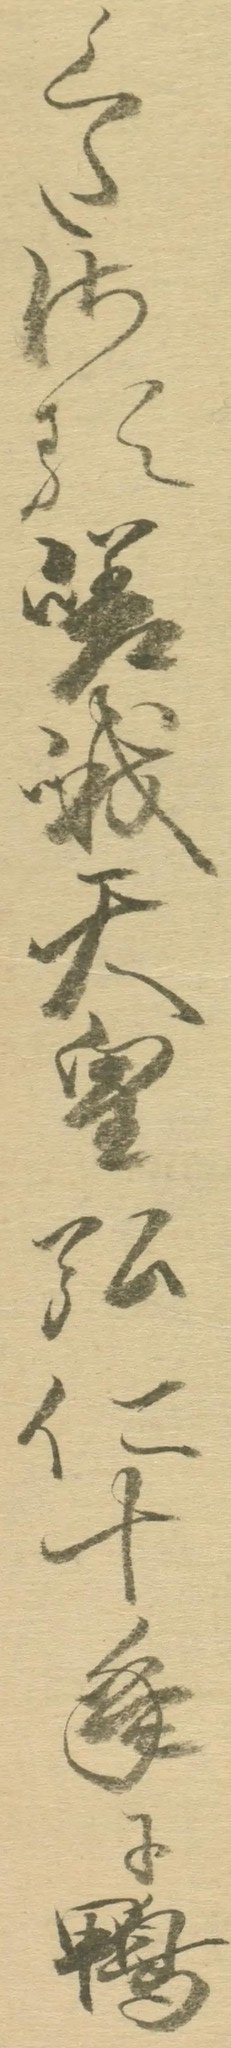くたさる嵯峨天皇弘仁十年に鴨
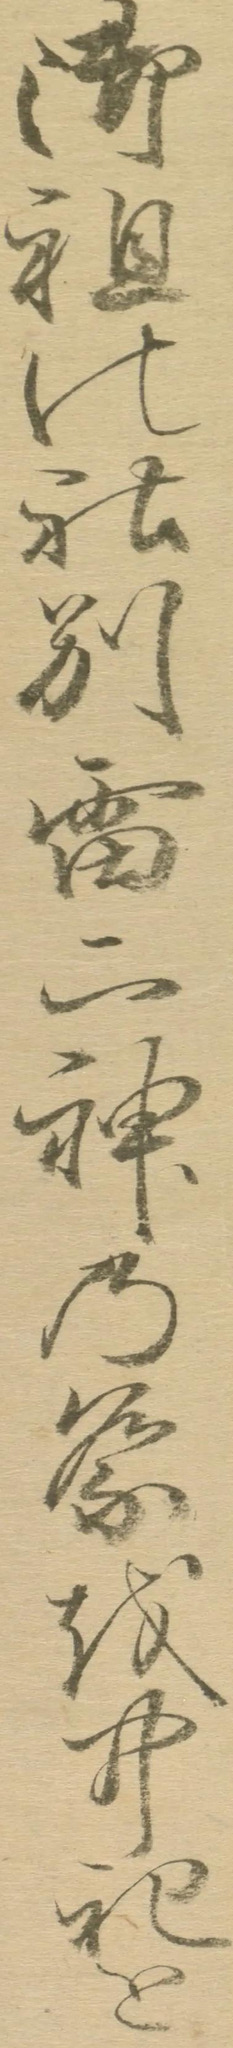御祖の社別雷二神の祭を中祀と
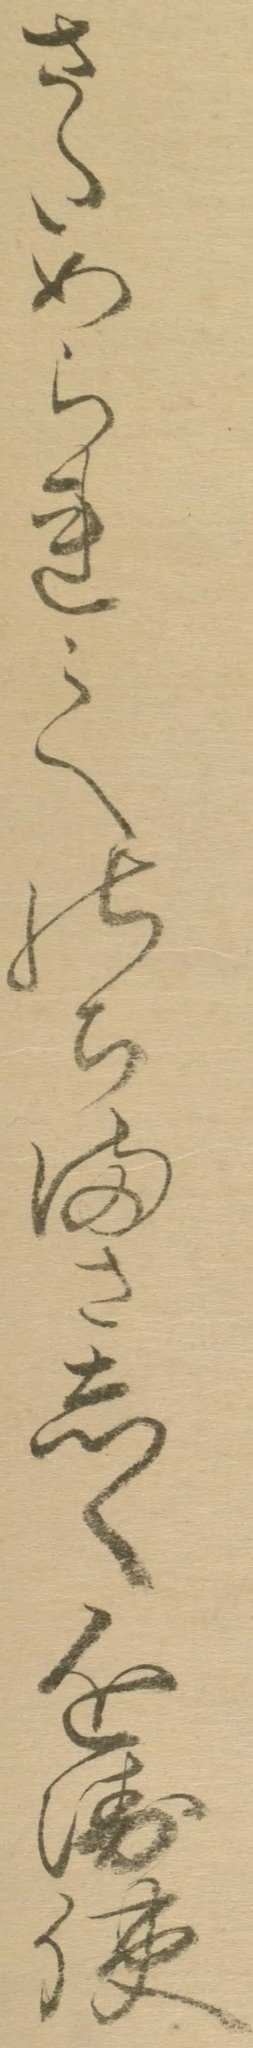さためられてのちまさしく近衛使

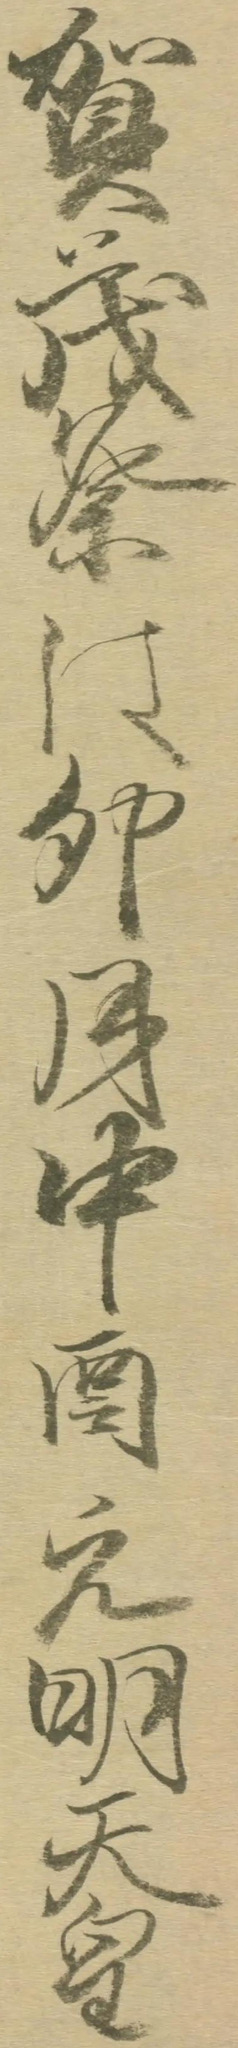賀茂祭は卯月中酉元明天皇
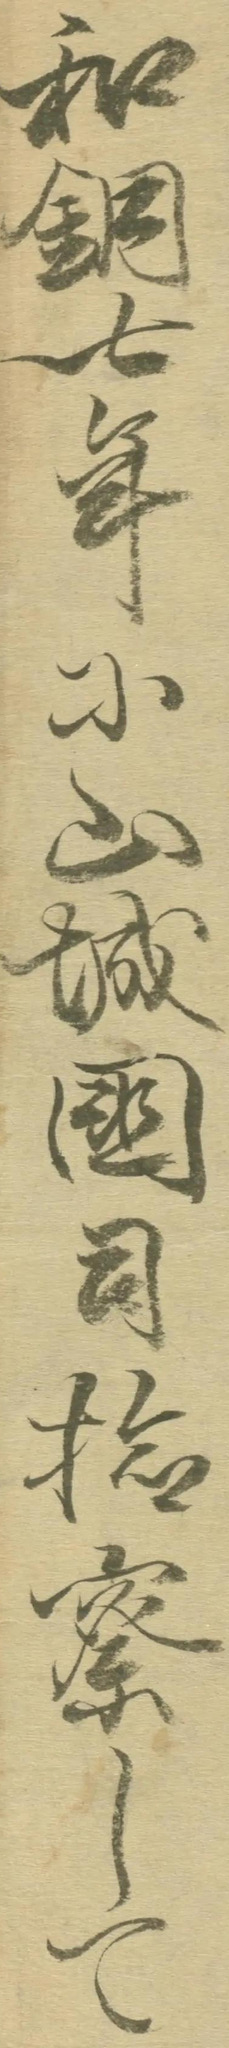和銅七年に山城国司撿察して
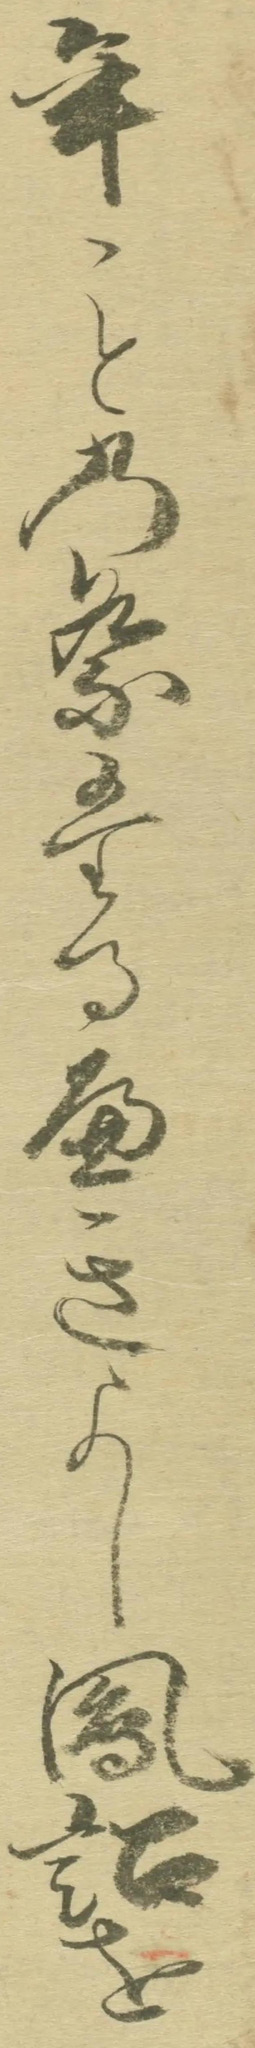年ことの祭たるへきよし鳳詔を
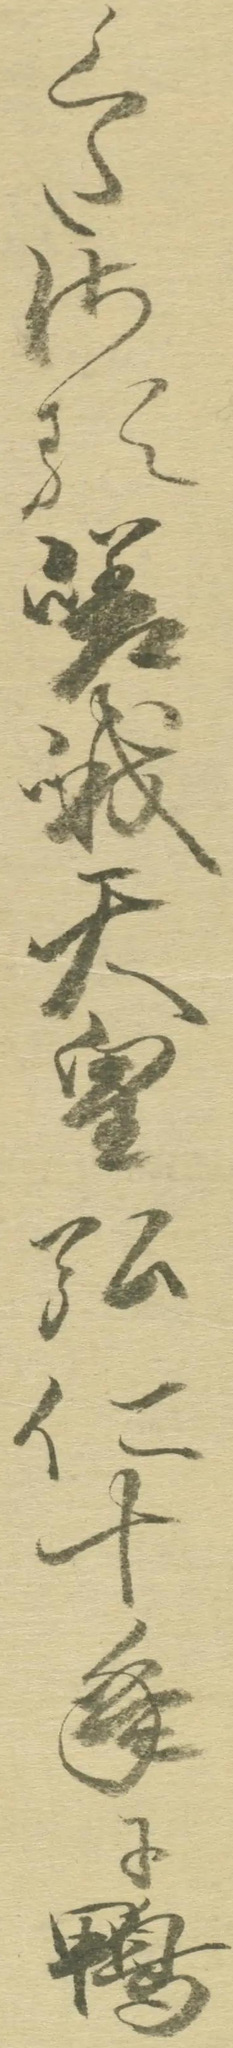くたさる嵯峨天皇弘仁十年に鴨
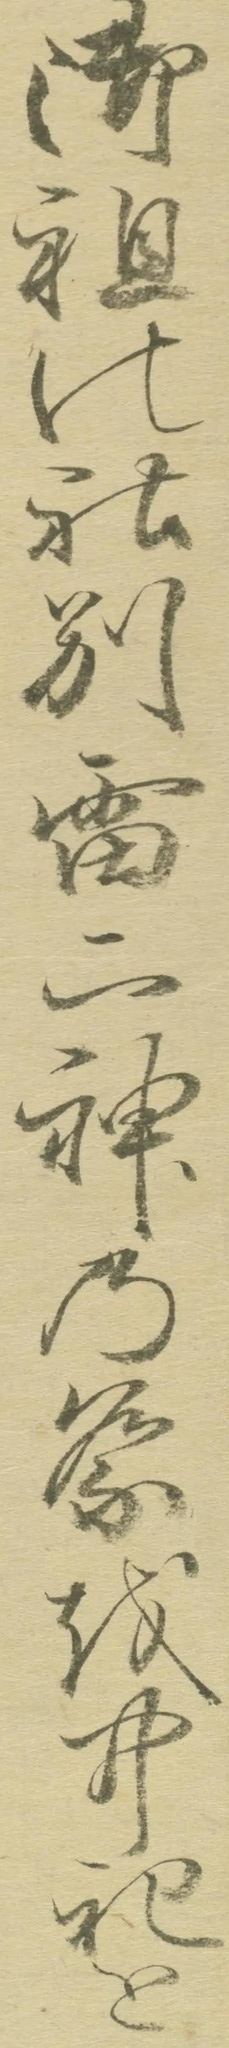御祖の社別雷二神の祭を中祀と
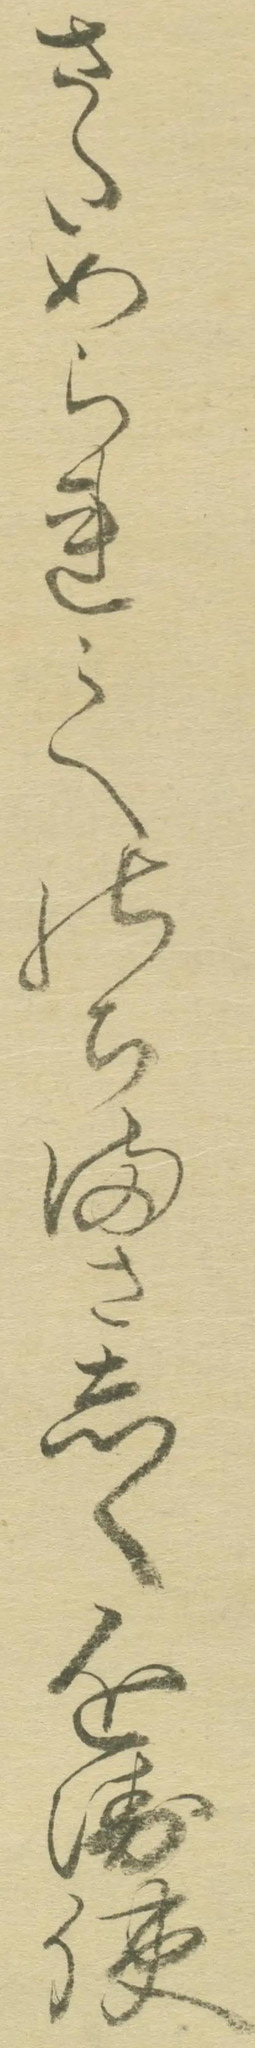さためられてのちまさしく近衛使
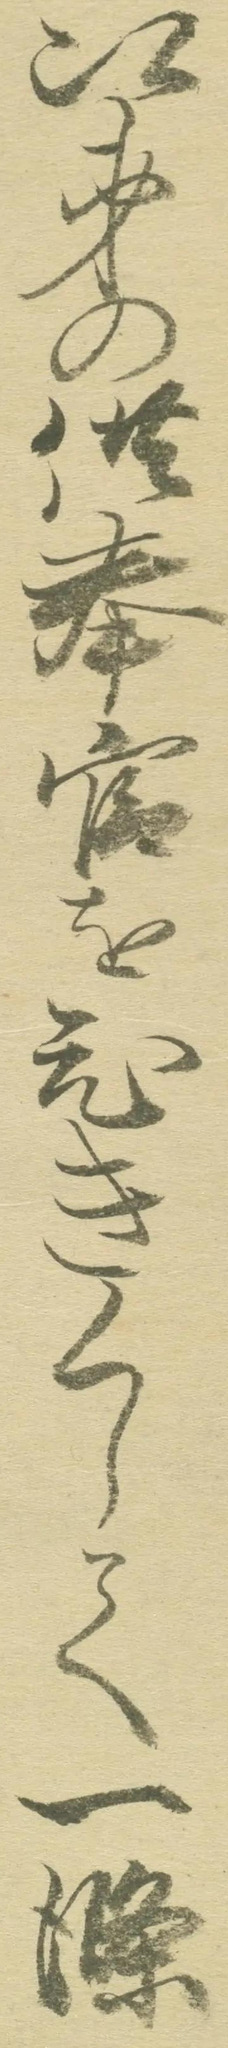次第の供奉官をひきくして一条
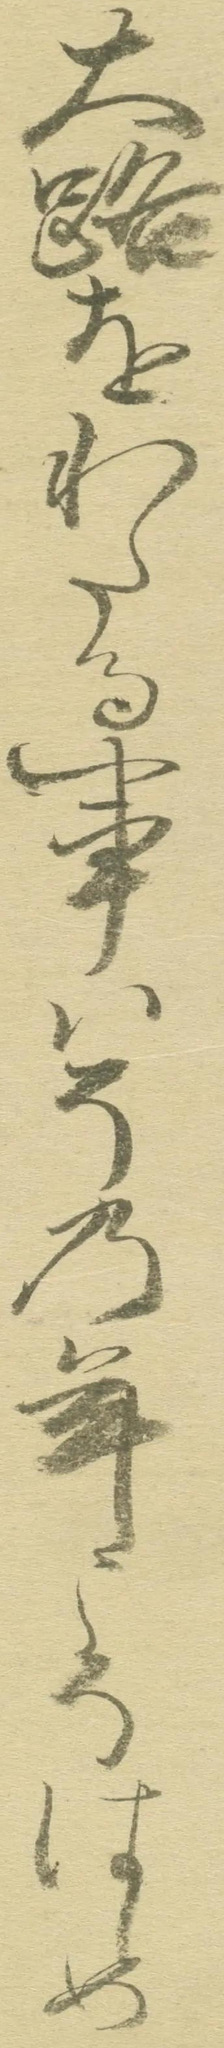大路をわたる事はその年こそはしめ
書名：賀茂祭縁起
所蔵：国立国会図書館 National Diet Library, JAPAN
